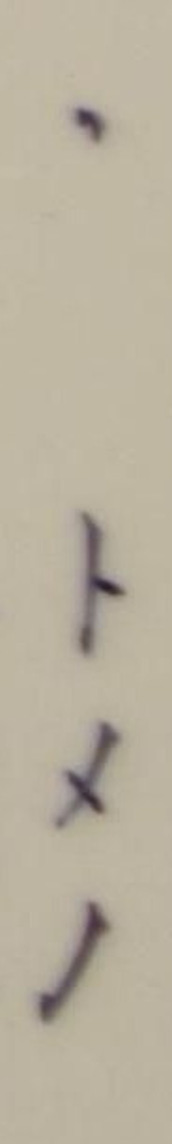トメノ
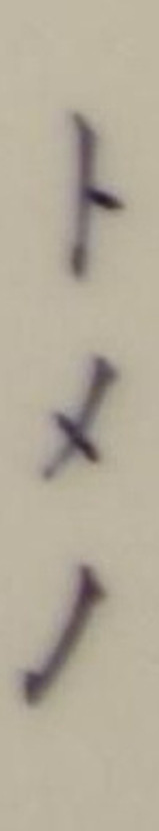トメノ
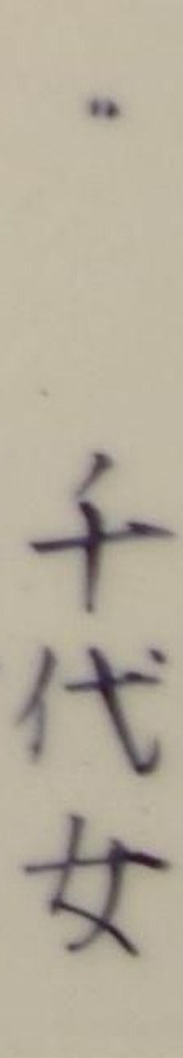千代女
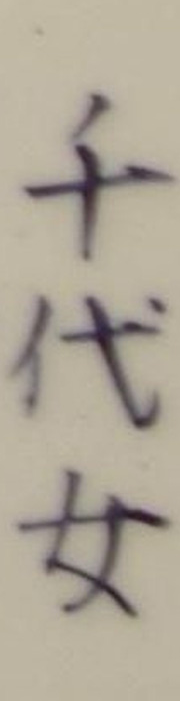千代女
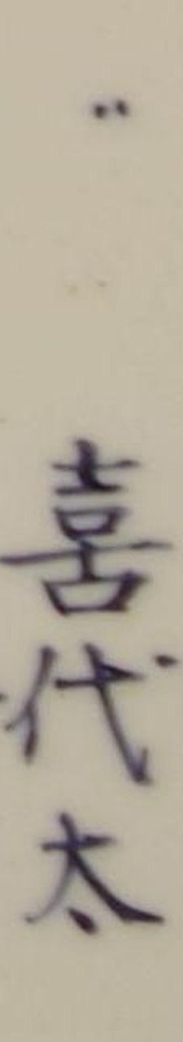喜代太
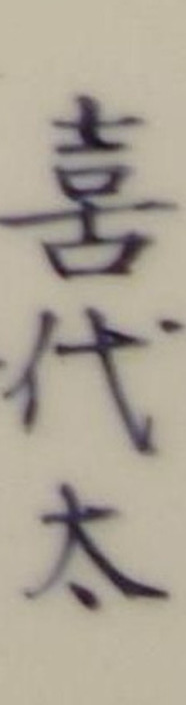喜代太
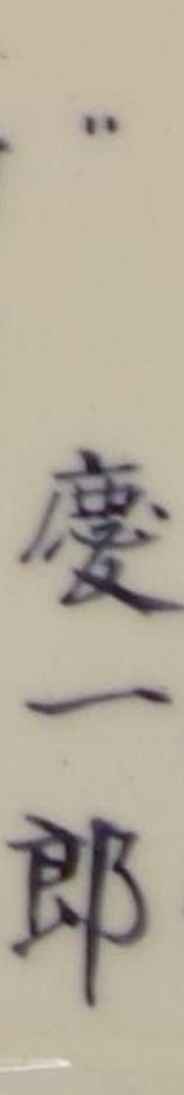慶一郎
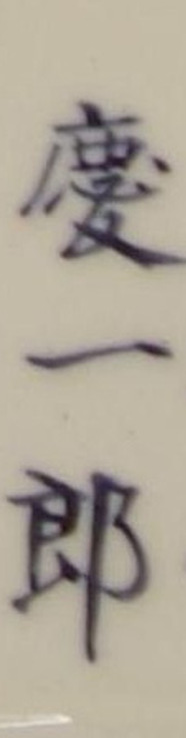慶一郎
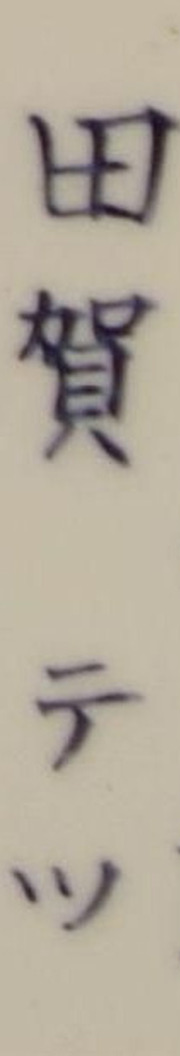田賀テツ
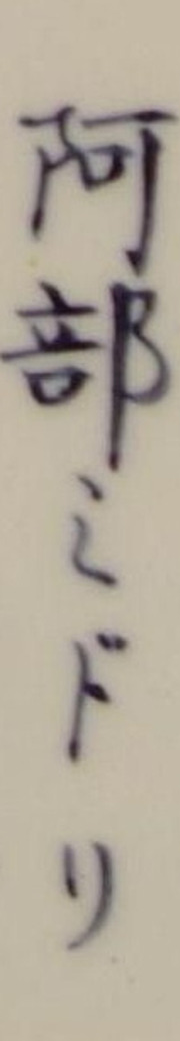阿部ミドリ
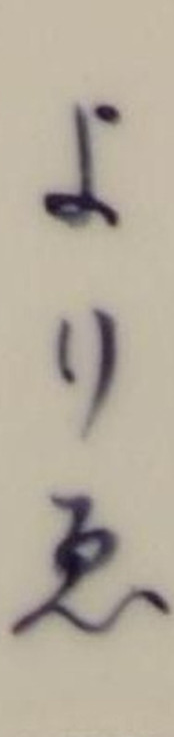よりゑ
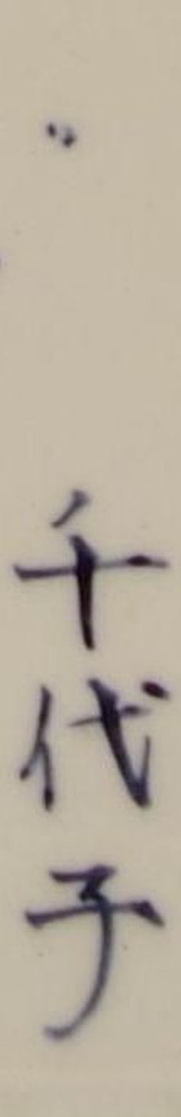千代子
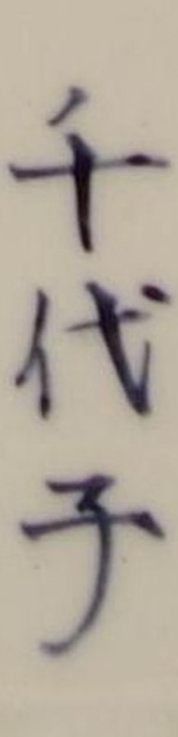千代女
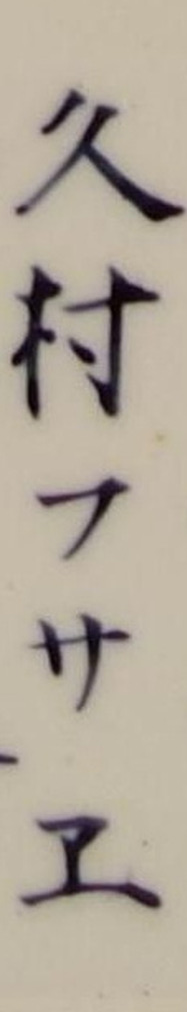久村フサヱ
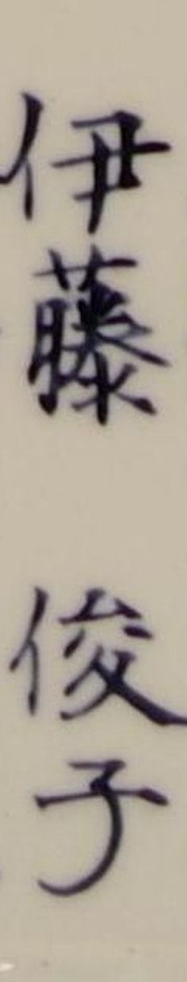伊藤俊子
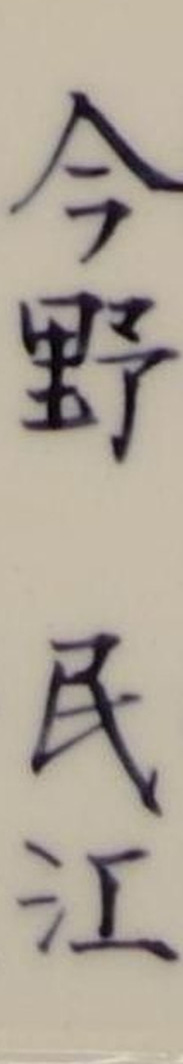今野民江
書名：M~S
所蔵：高野山金剛峯寺
